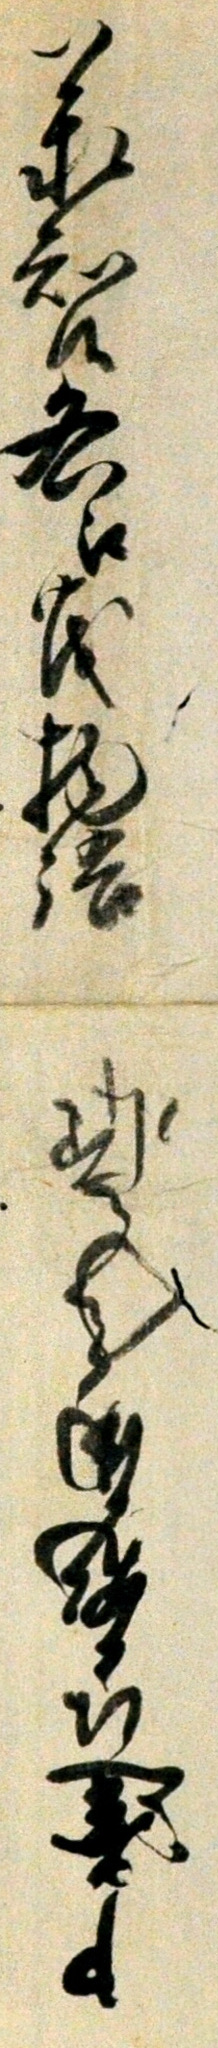承知候各江茂物語
